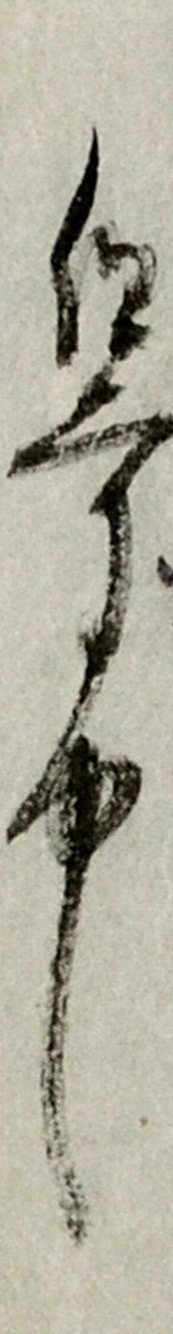但二月中
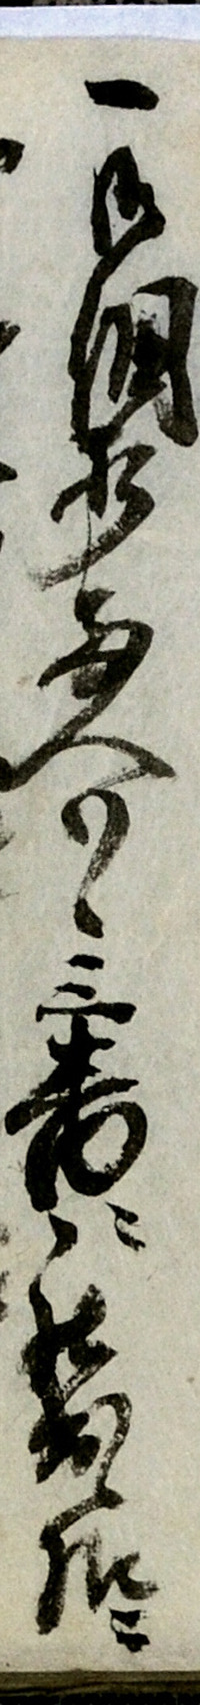一御網打両人ツヽ番ニ罷出候様ニ
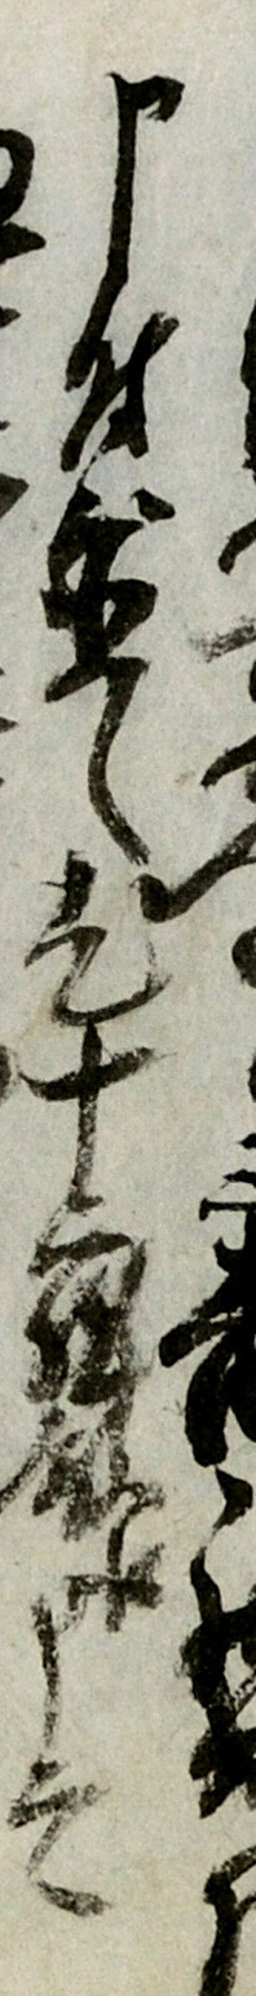申付置候尤十蔵殿え申上候
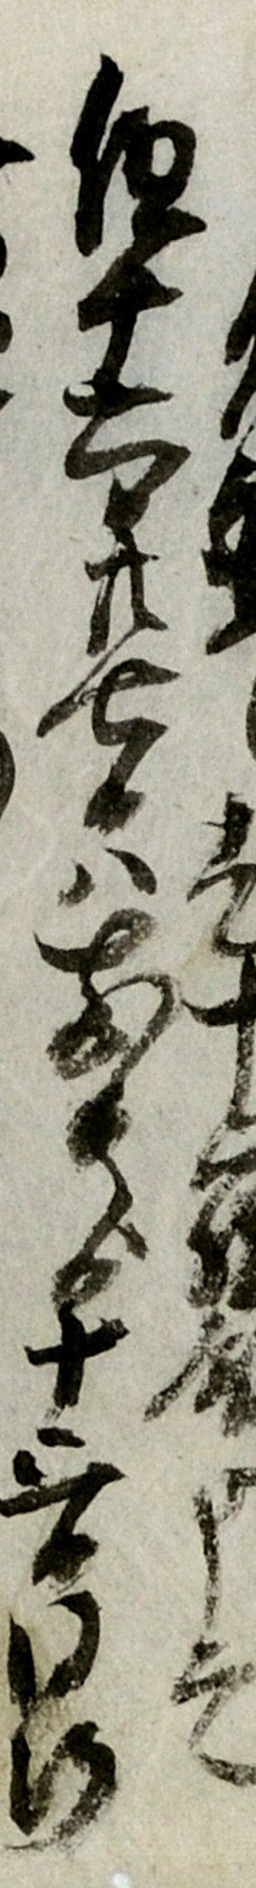但十六日廿七日ハ前日ゟ十三日同断
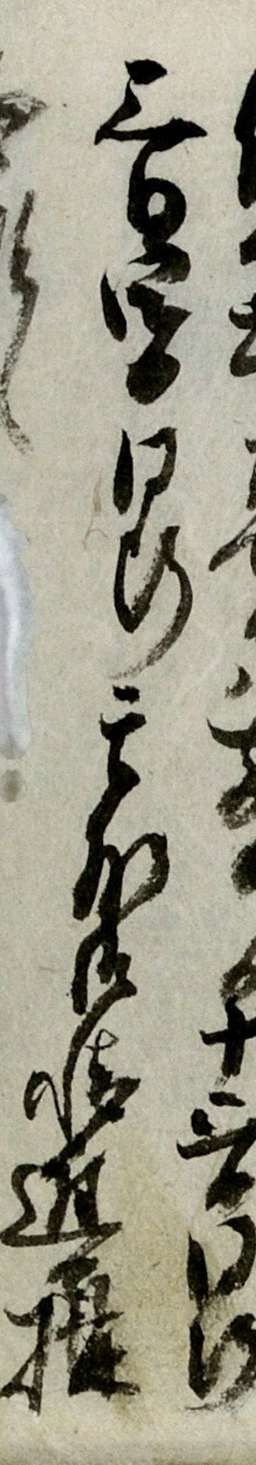三日四日同断其外御精進慎
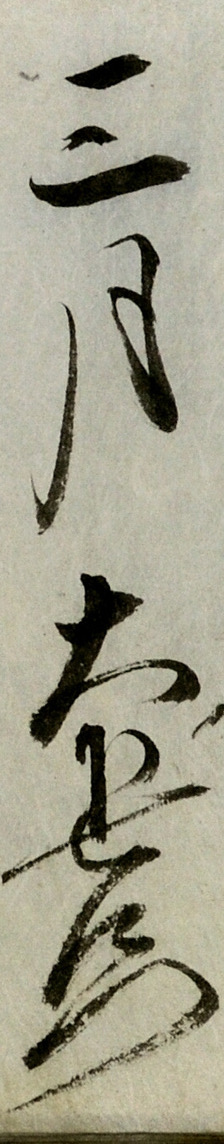三月大下七左衛門

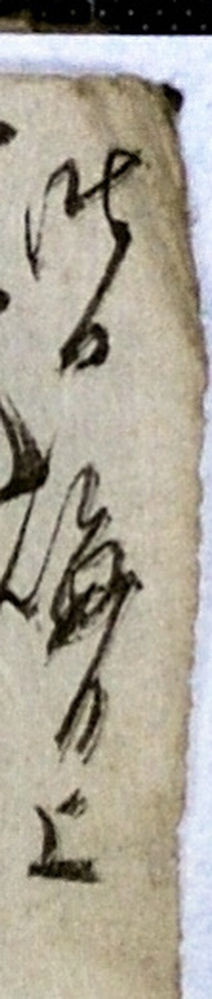昨日晦日迄
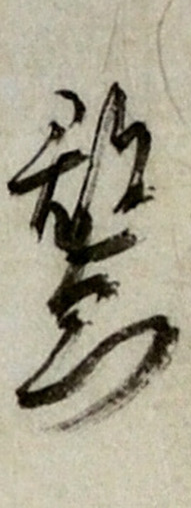勘右衛門
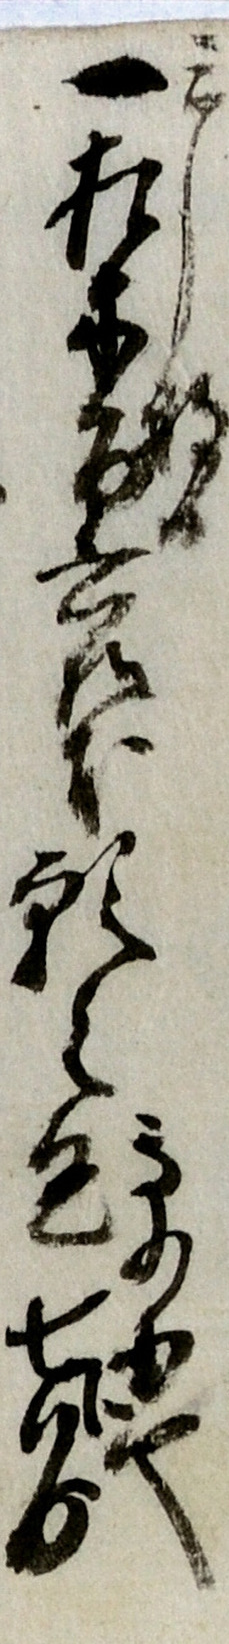一松木百六拾本願之通七郎左衛門
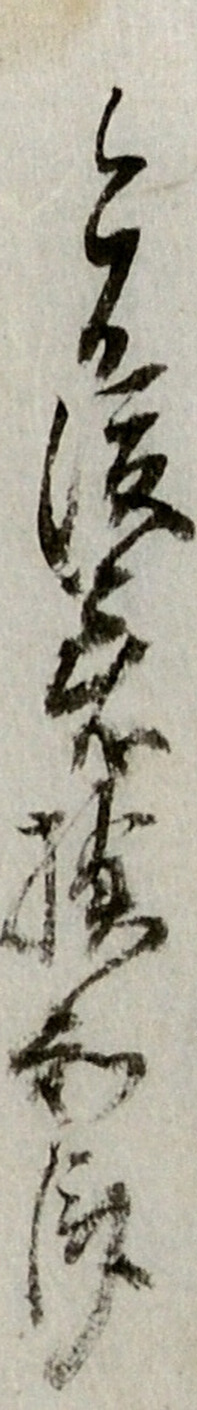今日渡着検知済
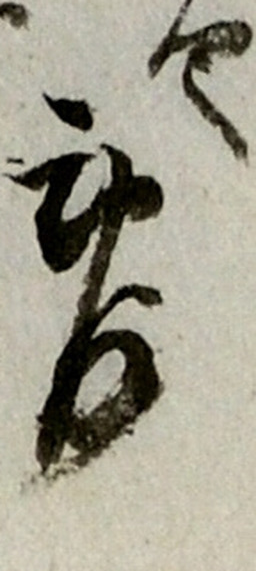勘右衛門
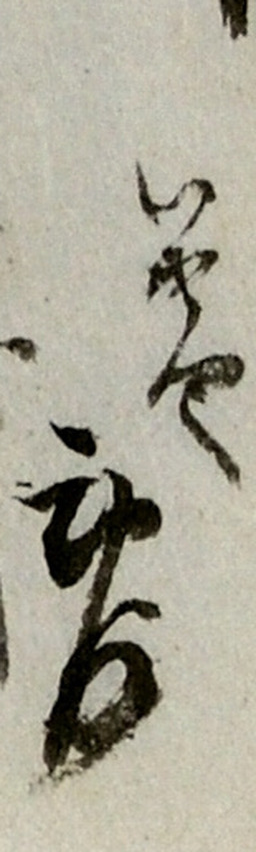勘右衛門
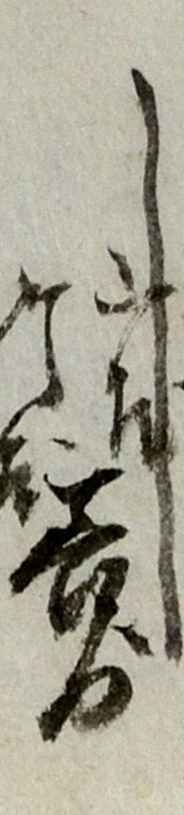勘右衛門
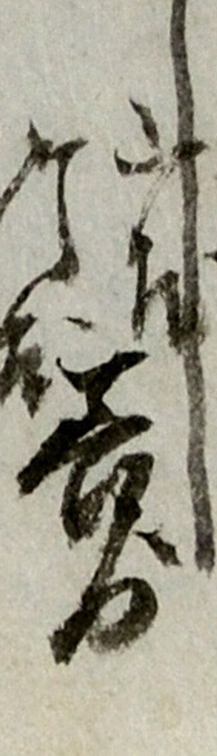内善右衛門
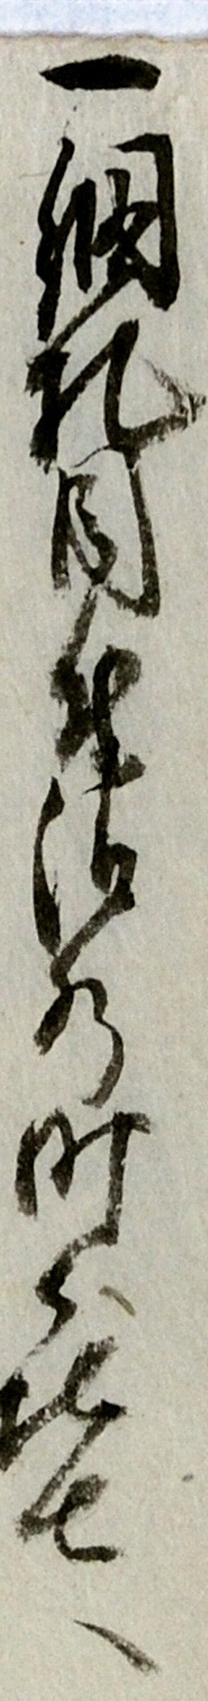一網札目付清水町ゟ池七へ
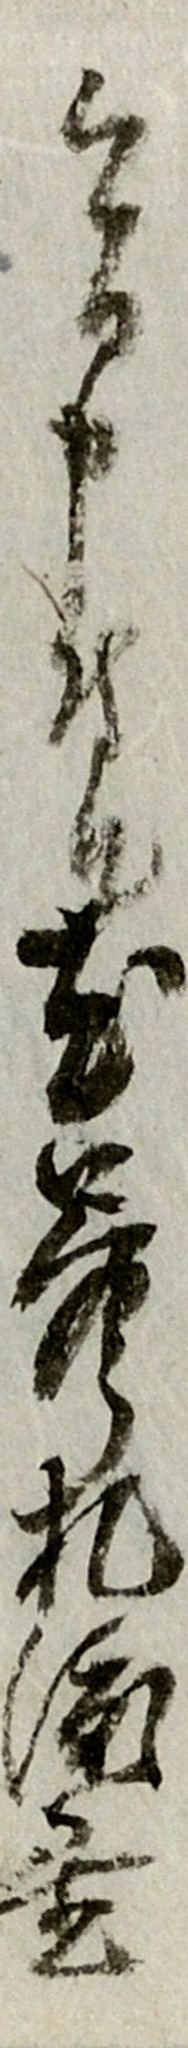今日申付候尤札渡置
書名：分一方諸事御用留帳
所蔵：伊那市立高遠町図書館・合同会社AMANE
